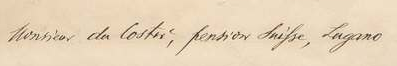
Monsieur du Coster, pension Suisse, Lugano
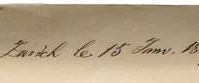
Locarno, resp. Bellinzona,
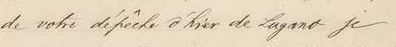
de votre dépêche d'hier de Lugano je
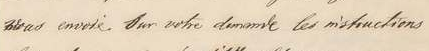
vous envoie sur votre demande les instructions
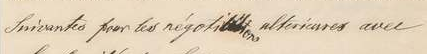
suivantes pour les négotiations ultérieures avec
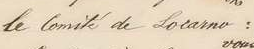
le Comité de Locarno:
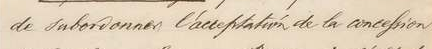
de subordonner l'acceptation de la concession
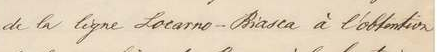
de la ligne Locarno–Biasca à l'obtention
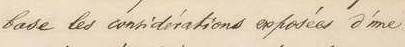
base les considérations exposées d'une
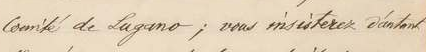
Comité de Lugano; vous insisterez d'autant
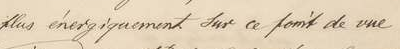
plus énergiquement sur ce point de vue
